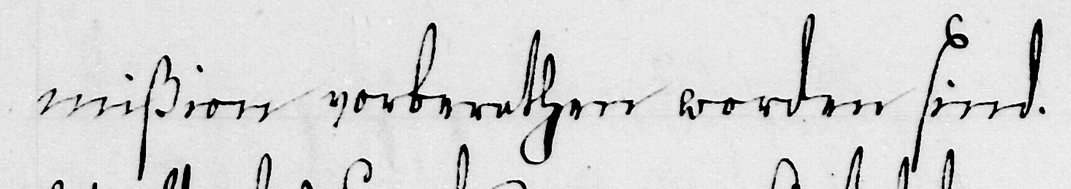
mißion vorberathen worden sind.
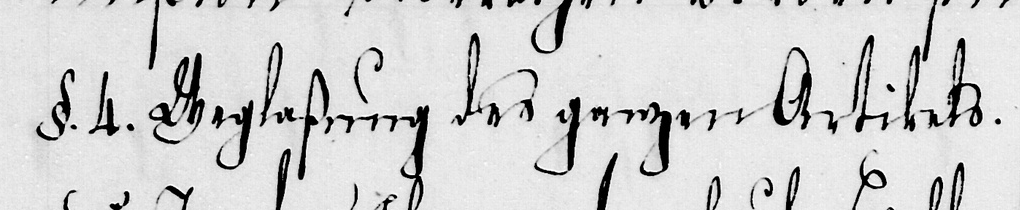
§. 4. Weglaßung des ganzen Artikels.
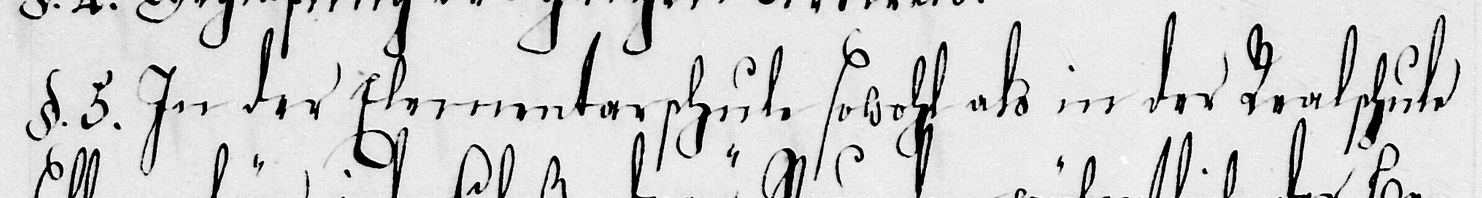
§. 5. In der Elementarschule sowohl als in der Realschule
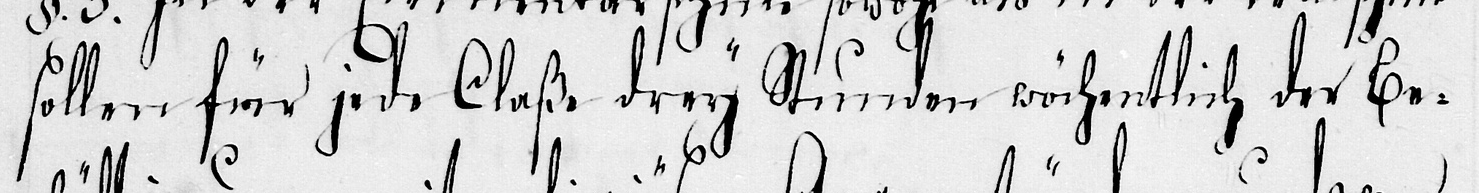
sollen für jede Claße drey Stunden wöchentlich der Be¬
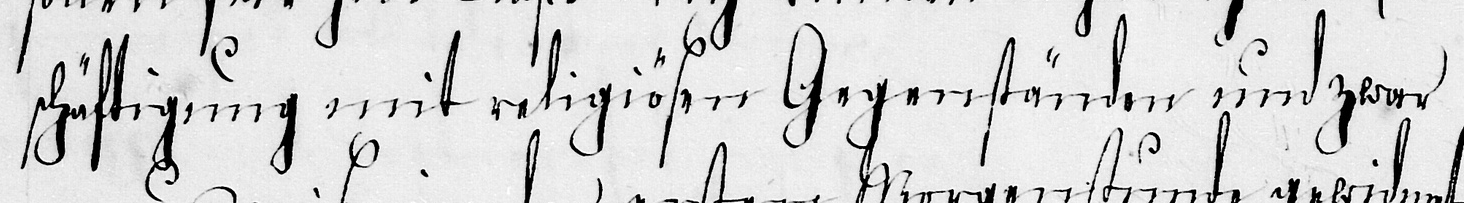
schäftigung mit religiösen Gegenständen und zwar
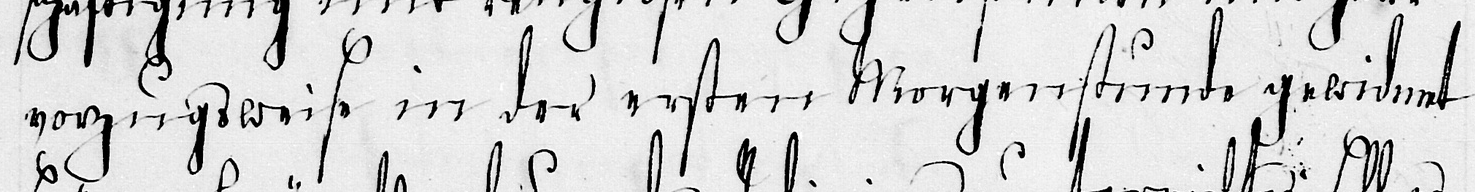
vorzugsweise in der ersten Morgenstunde gewidmet
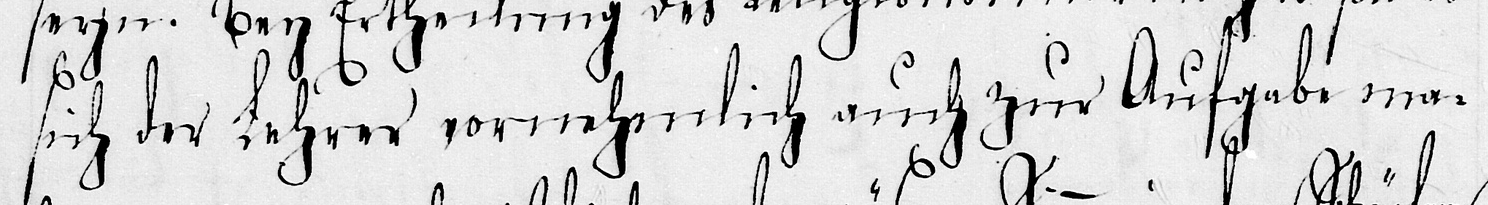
sich der Lehrer vornehmlich auch zur Aufgabe ma¬
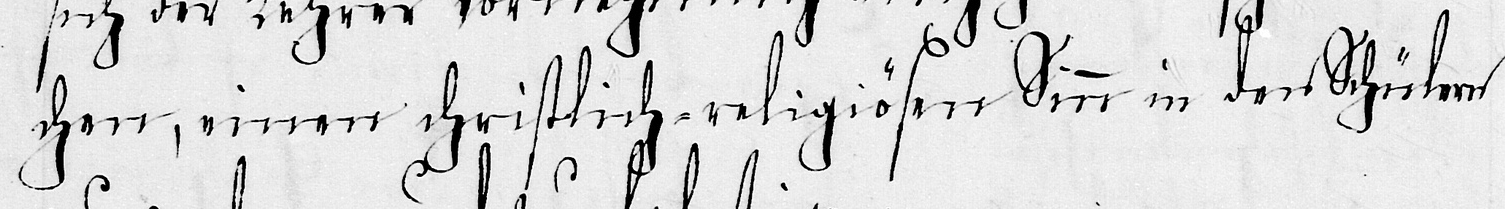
chen, einen christlich-religiösen Sinn in den Schülern
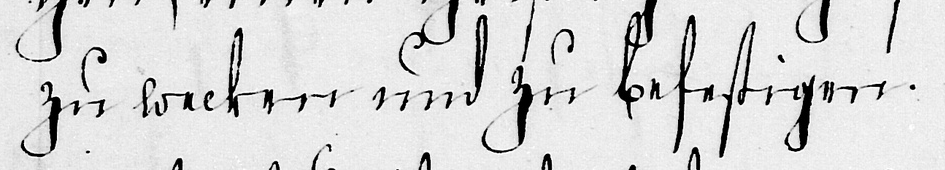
zu wecken und zu befestigen.
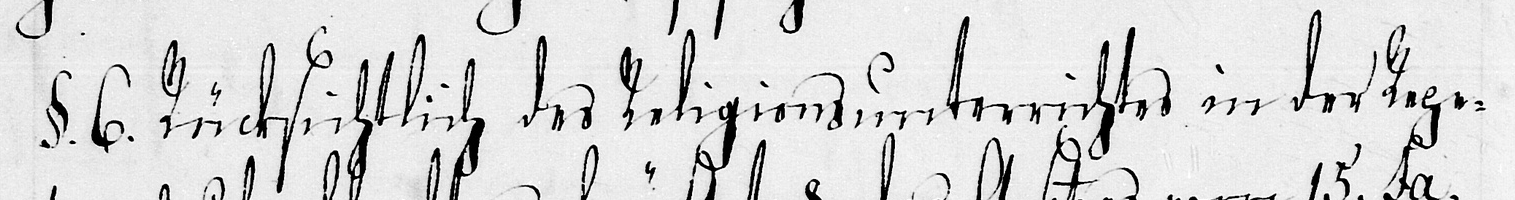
§. 6. Rücksichtlich des Religionsunterrichtes in der Repe¬
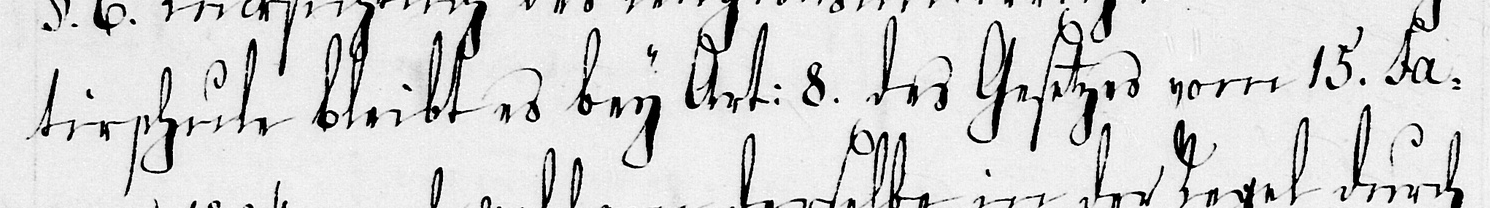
tirschule bleibt es bey Art: 8. des Gesetzes vom 15. Ja¬
